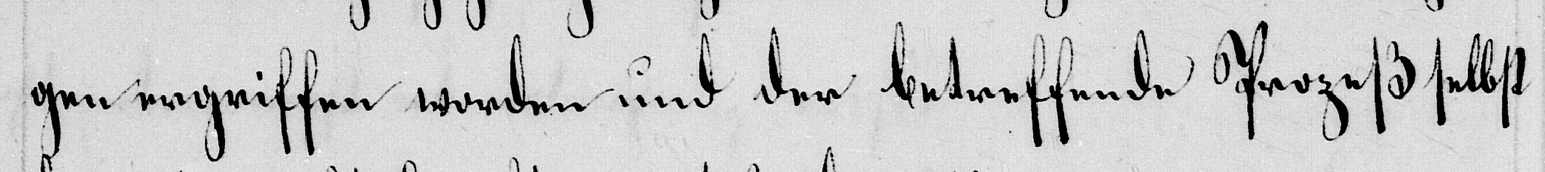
gen ergriffen werden und der betreffende Prozeß selbst
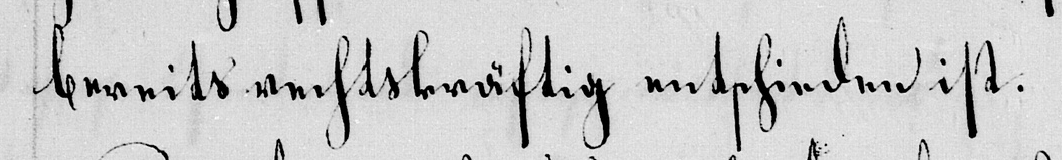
bereits rechtskräftig entschieden ist.
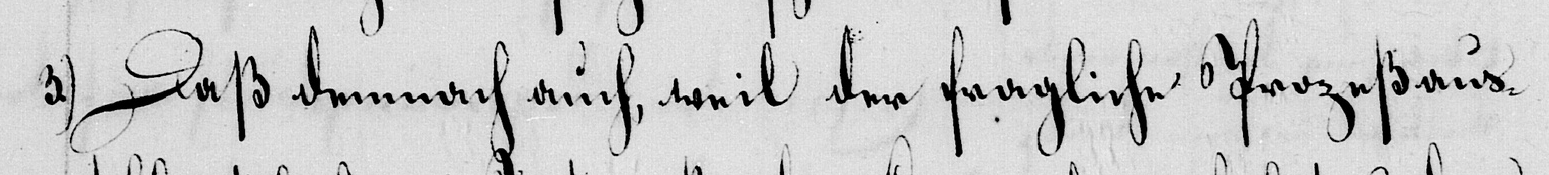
3.) Daß demnach auch, weil der fragliche Prozeß aus¬
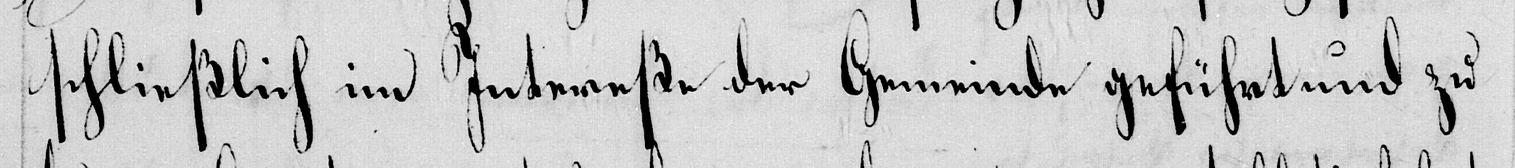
schließlich im Intereße der Gemeinde geführt und zu
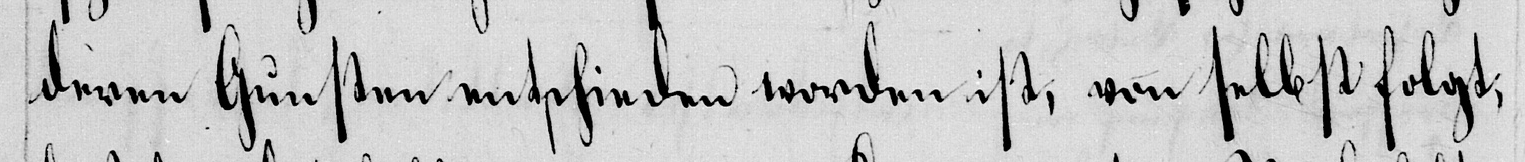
deren Gunsten entschieden worden ist, von selbst folgt,
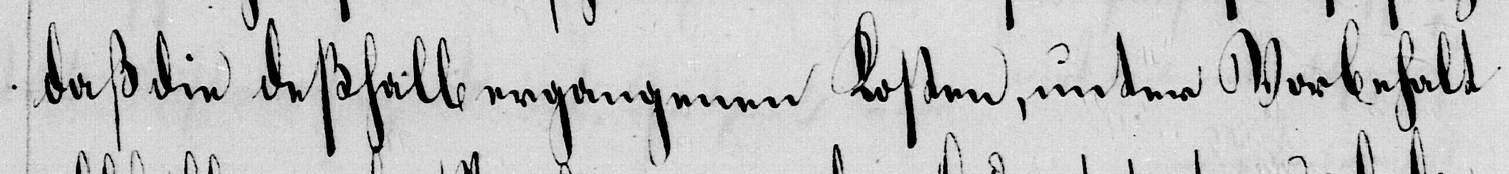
daß die deßhalb ergangenen Kosten, unter Vorbehalt
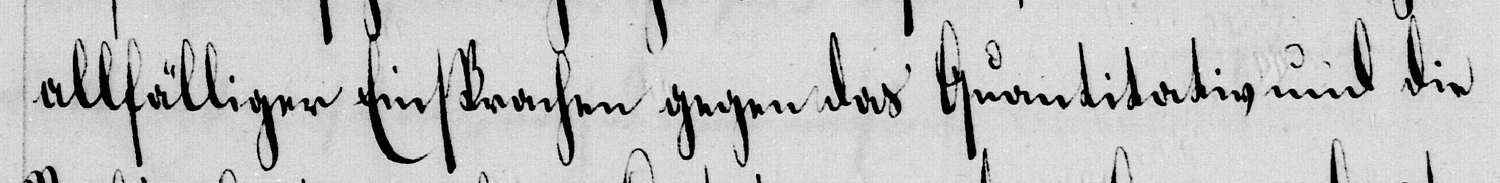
allfälliger Einsprachen gegen das Quantitativ und die
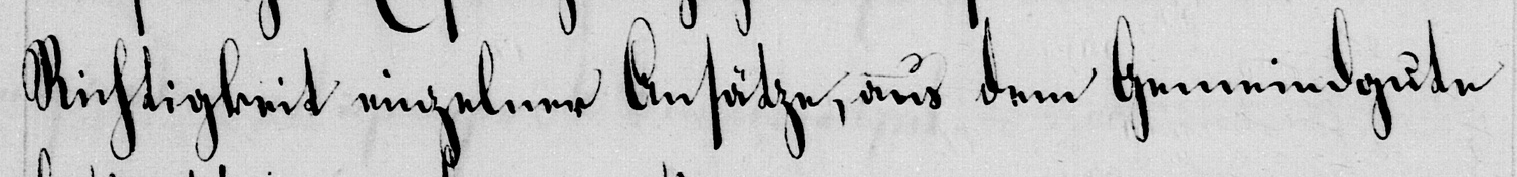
Richtigkeit einzelner Ansätze, aus dem Gemeindgute
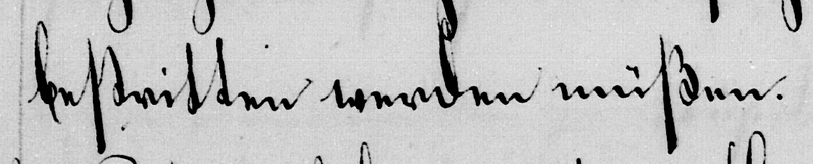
bestritten werden müßen.
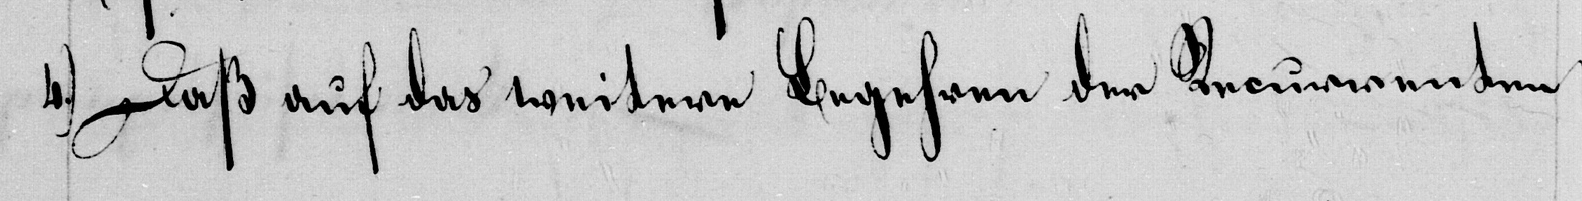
4.) Daß auf das weitere Begehren der Recurrenten
